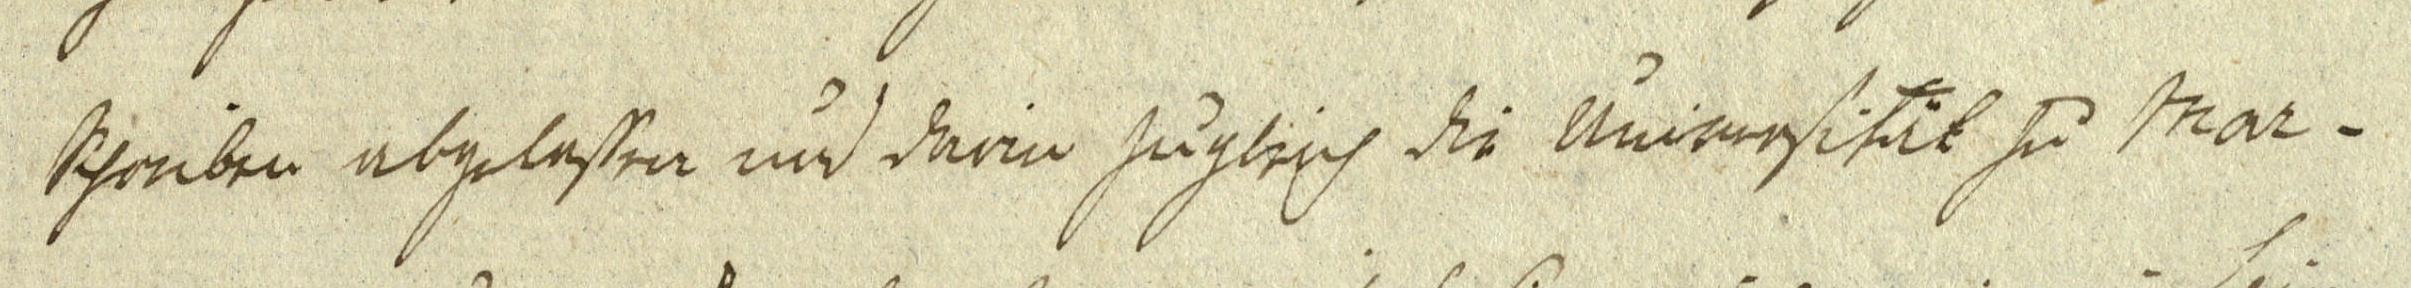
Schreiben abgelassen und darin zugleich die Universität zu Mar¬
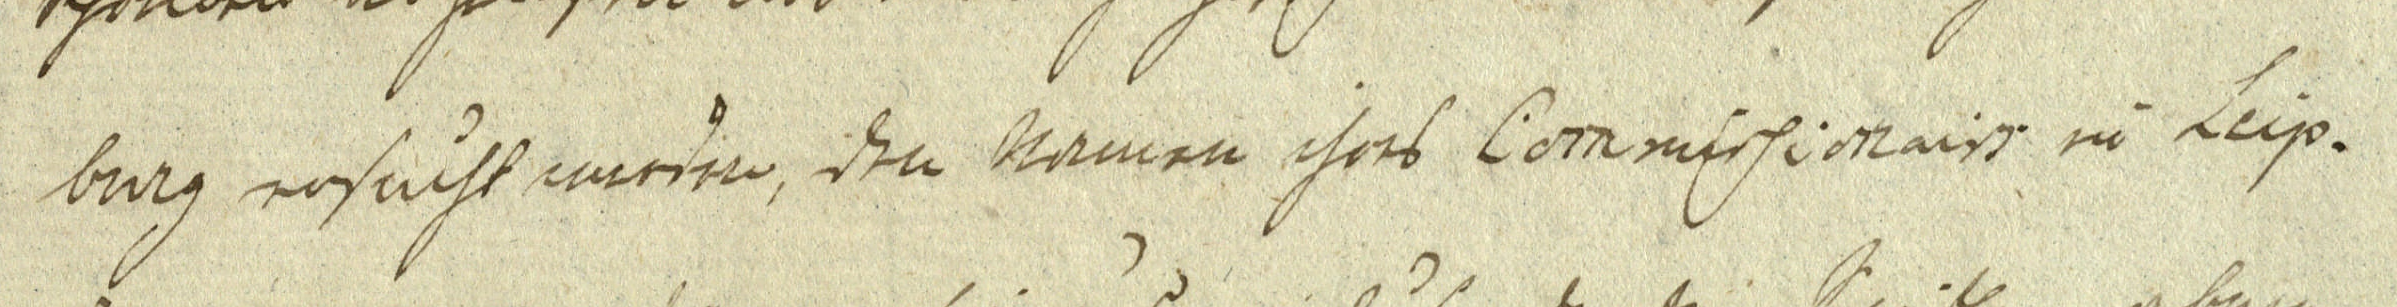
burg ersucht werden, den Namen ihres Commissionairs in Leip¬
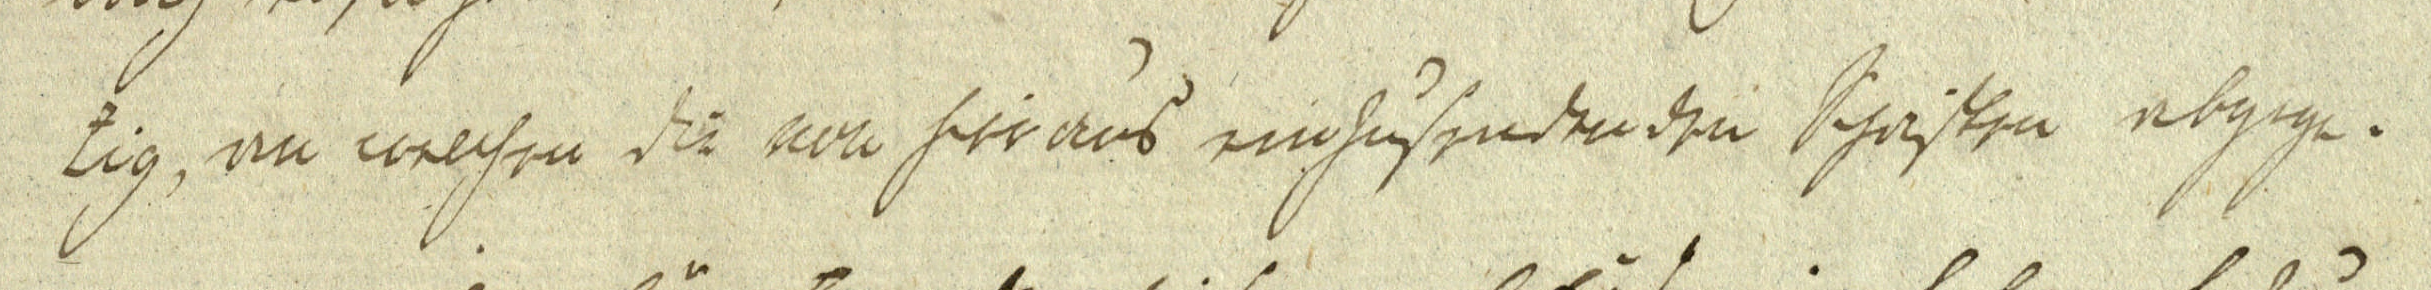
zig, an welchen die von hieraus einzusendenden Schriften abgege¬
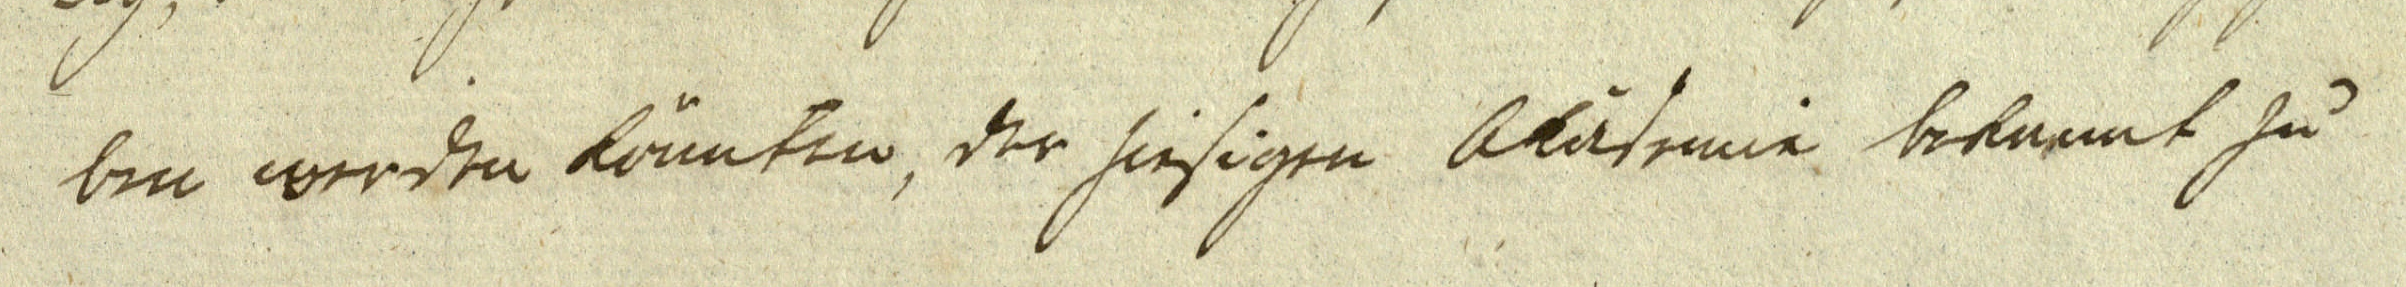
ben werden könnten, der hiesigen Akademie bekannt zu
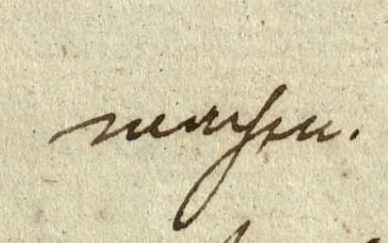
machen.
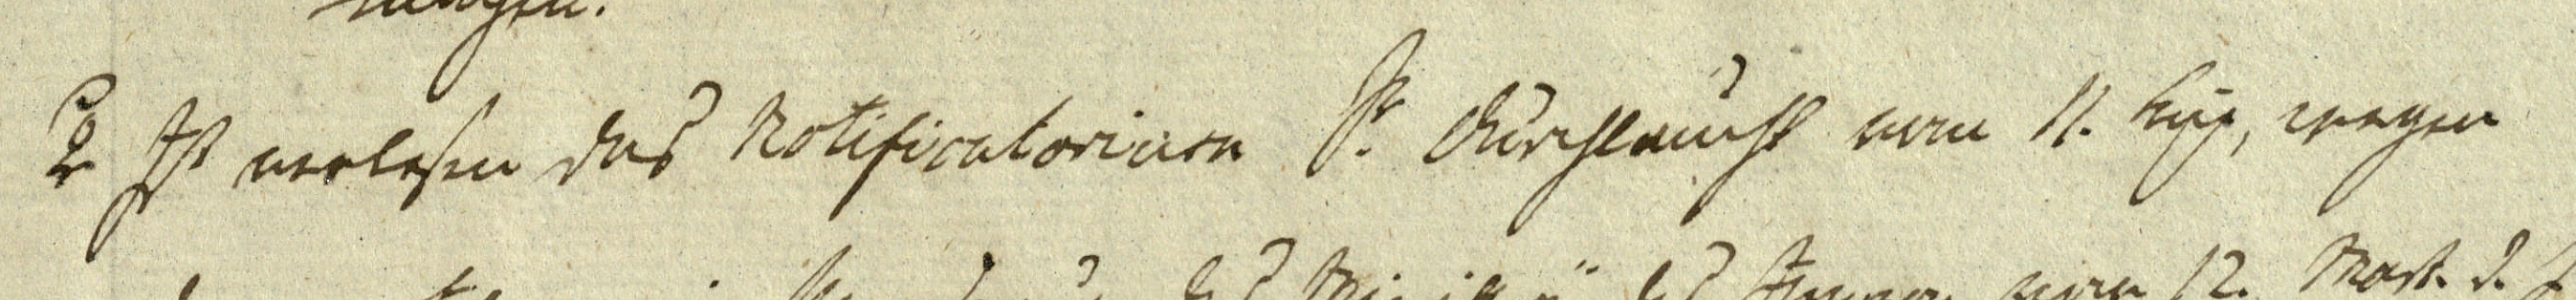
2. Ist verlesen das Notificatorium Sr. Durchlaucht vom 11. huj, wegen
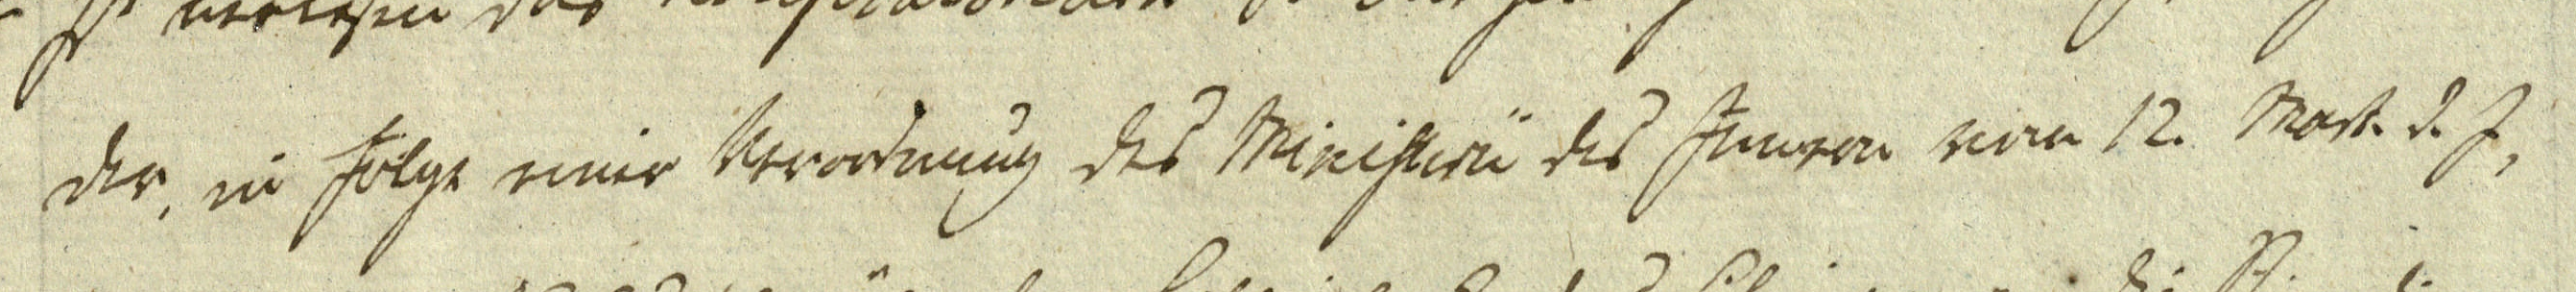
der, in Folge einer Verordnung des Ministerii des Innern vom 12. Mart. d. J,
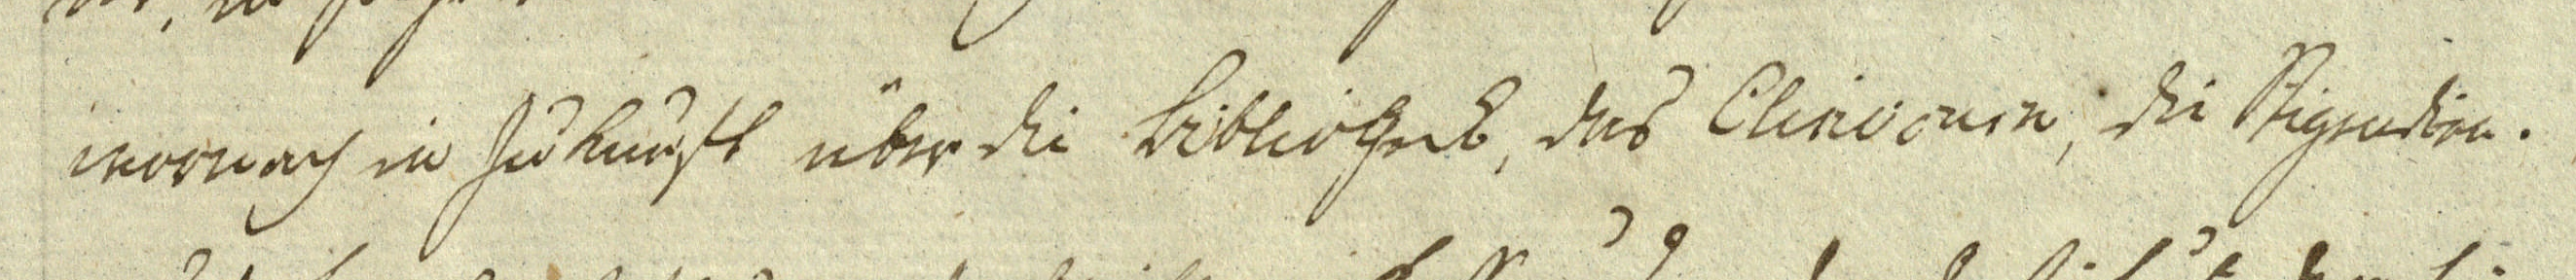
wornach in Zukunft über die Bibliothek, das Clinicum, die Stipendien
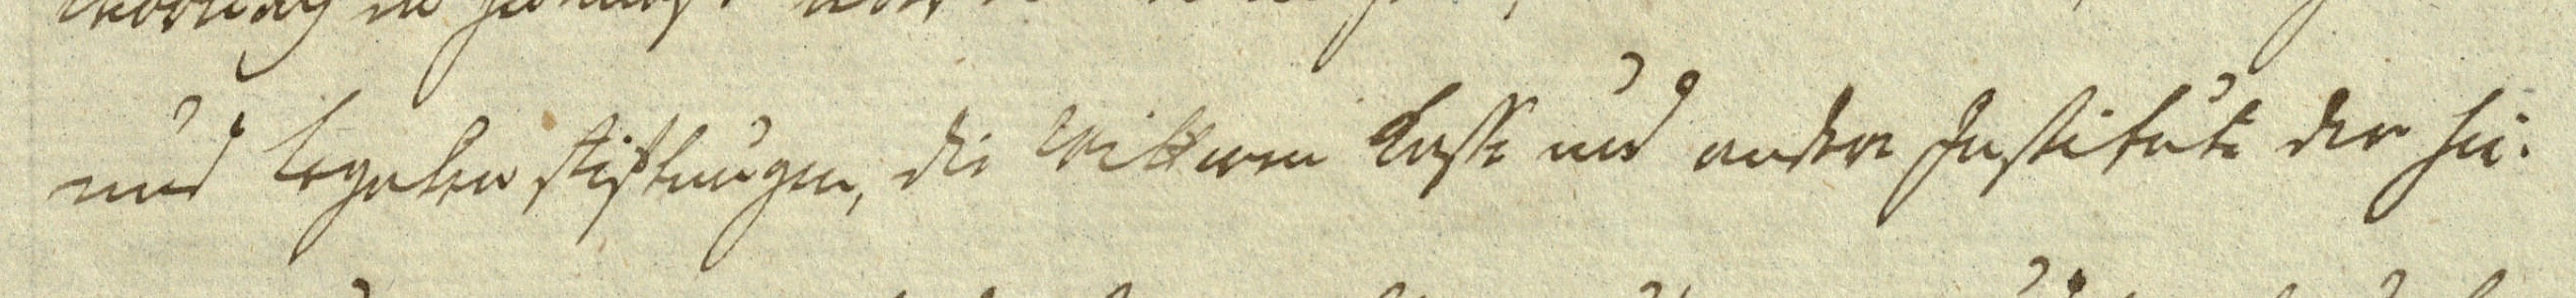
und Legatenstiftungen, die Wittwen Kasse und andere Institute der hie¬
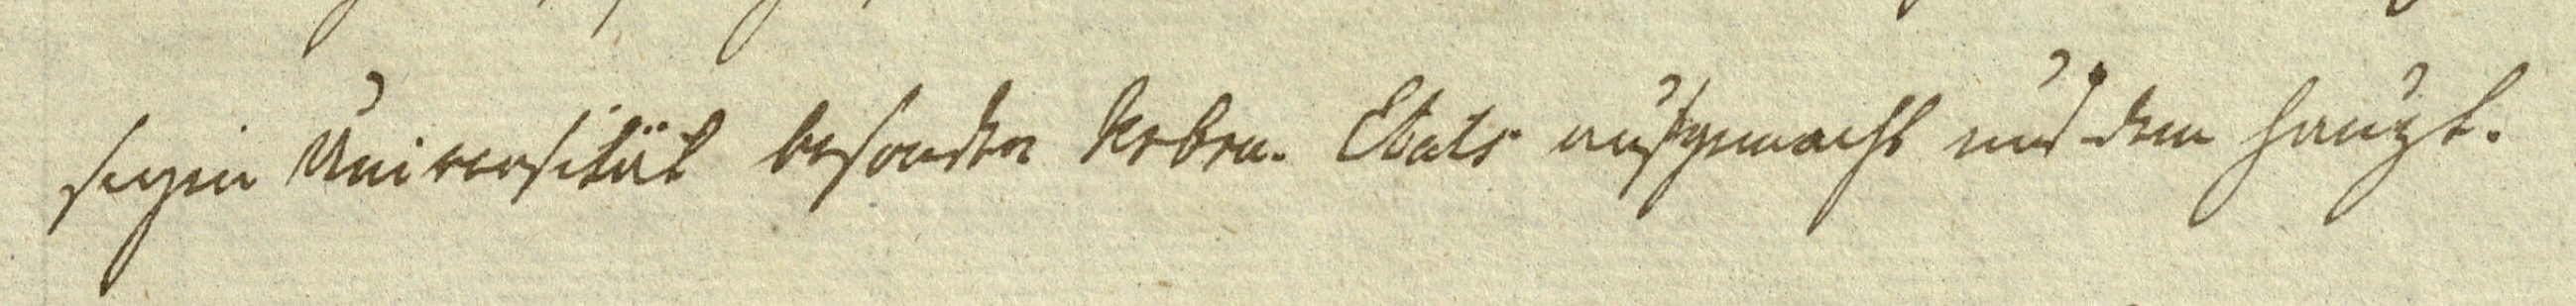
sigen Universität besondere Neben. Etats aufgemacht und dem Haupt-
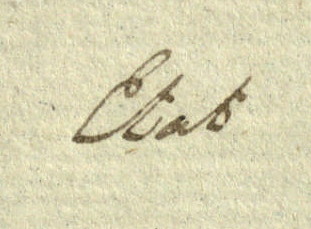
Etat
